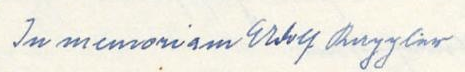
In memoriam Adolf Kappler
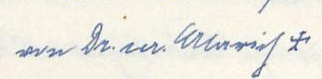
von Dr. cer. Alarich +
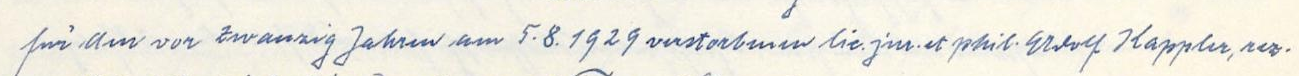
für den vor zwanzig Jahren am 5.8.1929 verstorbenen lic. iur. et. phil. Adolf Kappler, rez.
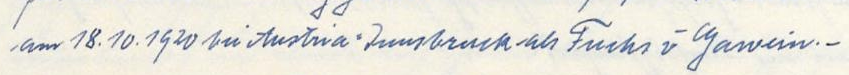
am 18.10.1920 bei Austria - Innsbruck als Fuchs v/o Gawein.
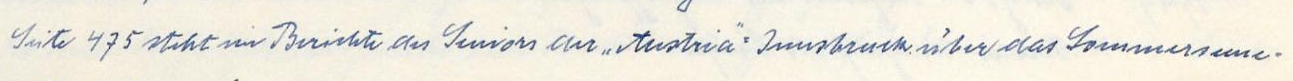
Seite 475 steht ein Bericht des Seniors der „Austria“-Innsbruck über das Sommerseme-
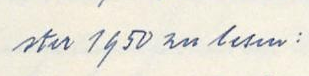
ster 1950 zu lesen:
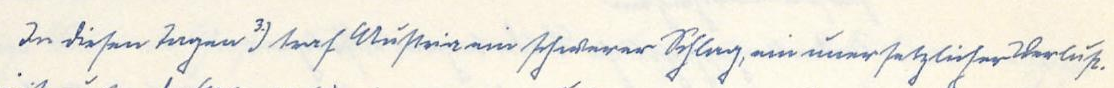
In diesen Tagen 3) traf Austria ein schwerer Schlag, ein unersetzlicher Verlust.
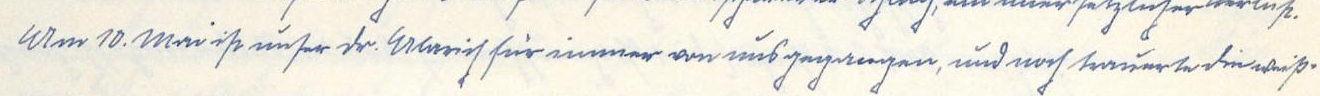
Am 10. März ist unser Dr. Alarich für immer von uns gegangen, und noch trauerte die weiß-
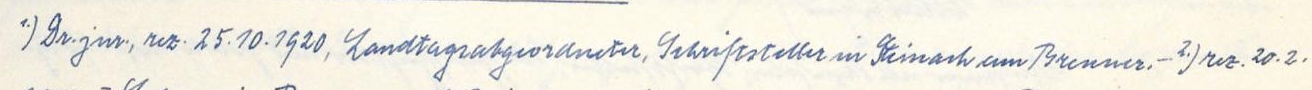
1) Dr. jur., rez. 25.10.1920, Landtagsabgeordneter, Schriftsteller in Steinach am Brenner.- 2)rez. 20.2.
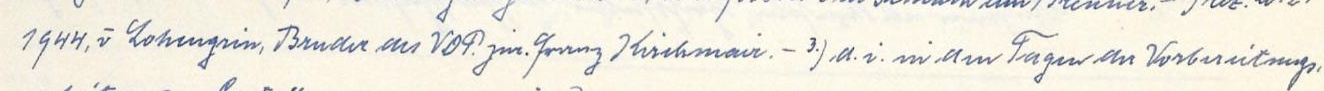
1944 v/o Lohengrin, Bruder des VOP iur. Franz Kirchmair. 3) d. i. in den Tagen der Vorbereitungs
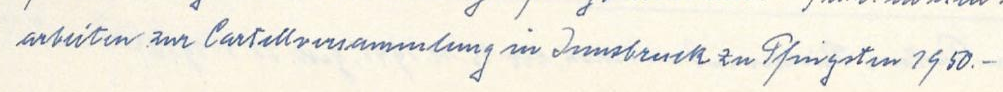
arbeiten zur Cartellversammlung in Innsbruck zu Pfingsten 1950.
